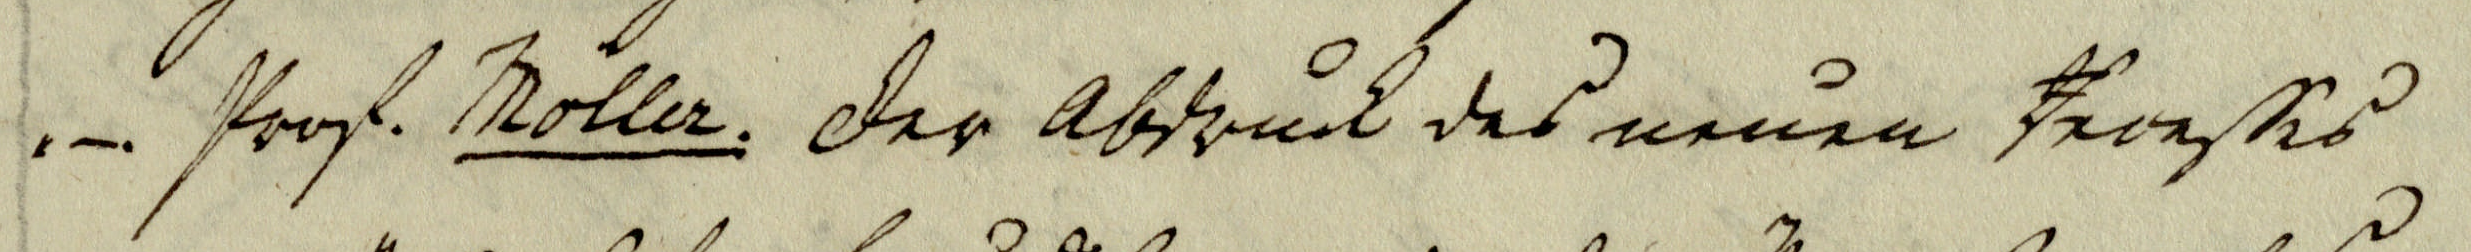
Prof. Möller. Der Abdruck des neuen Recesses
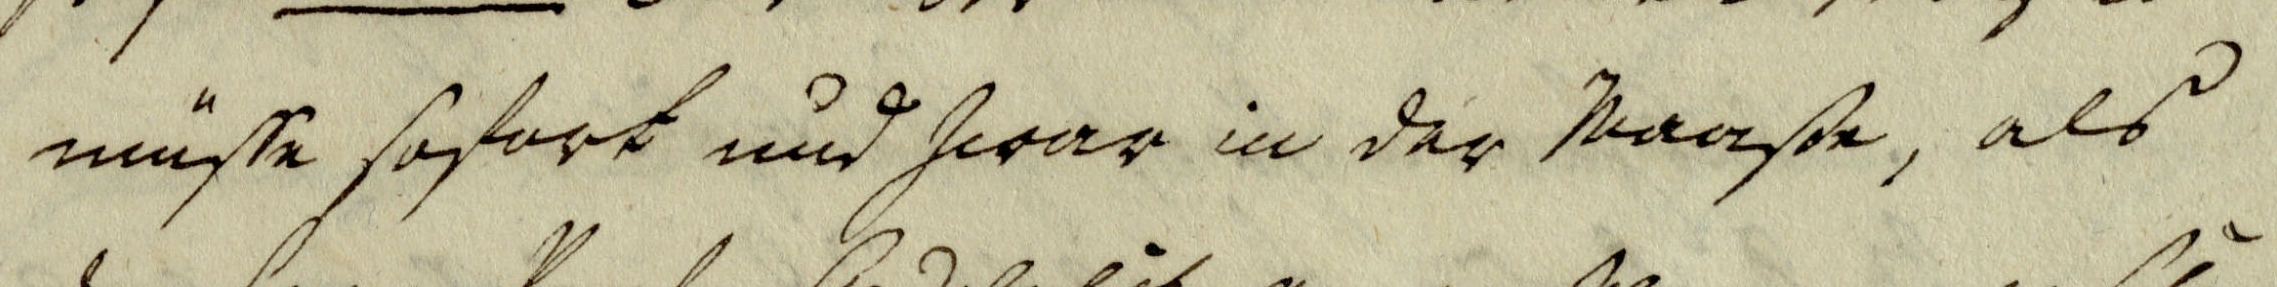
müsse sofort und zwar in der Maaße, als
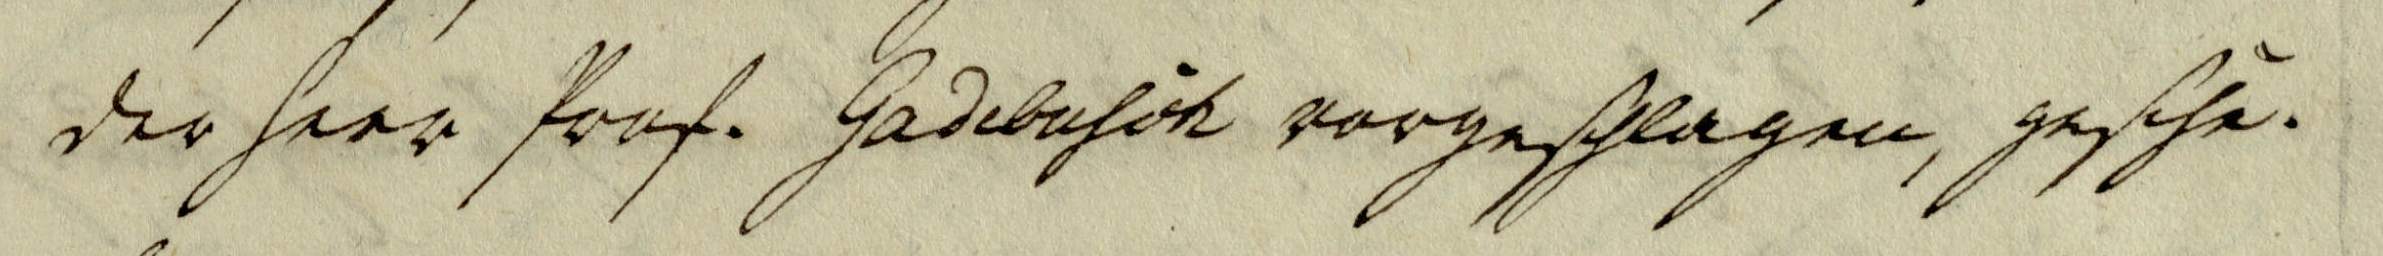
der Herr Prof. Gadebusch vorgeschlagen, gesche¬
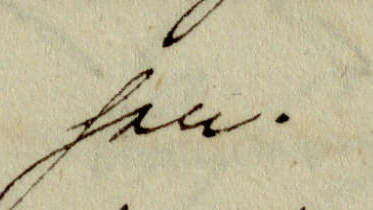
hen.
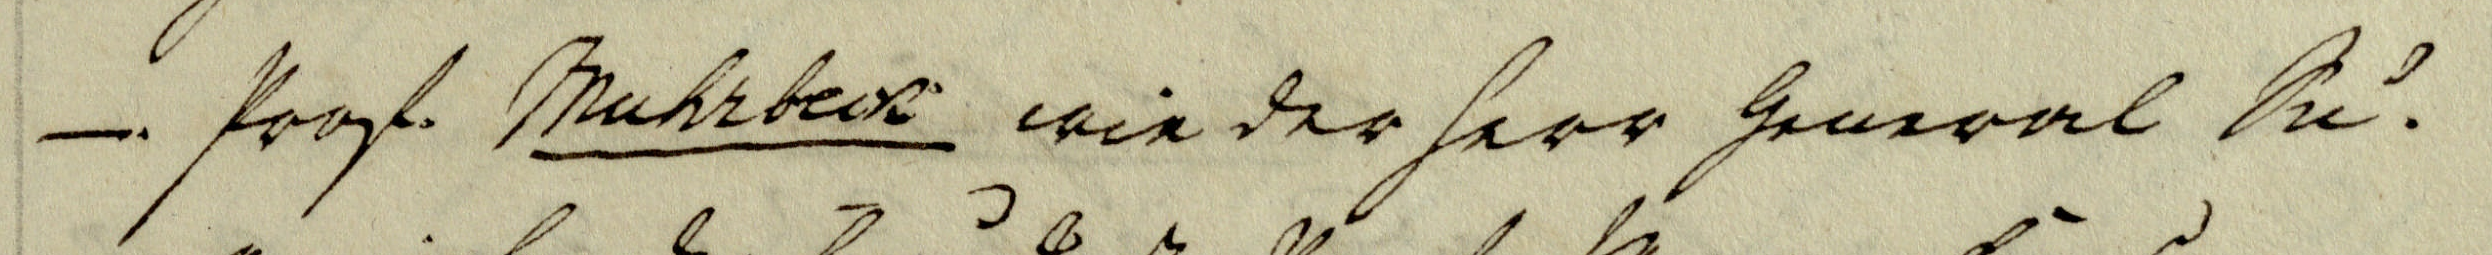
Prof. Muhrbeck wie der Herr General Su¬
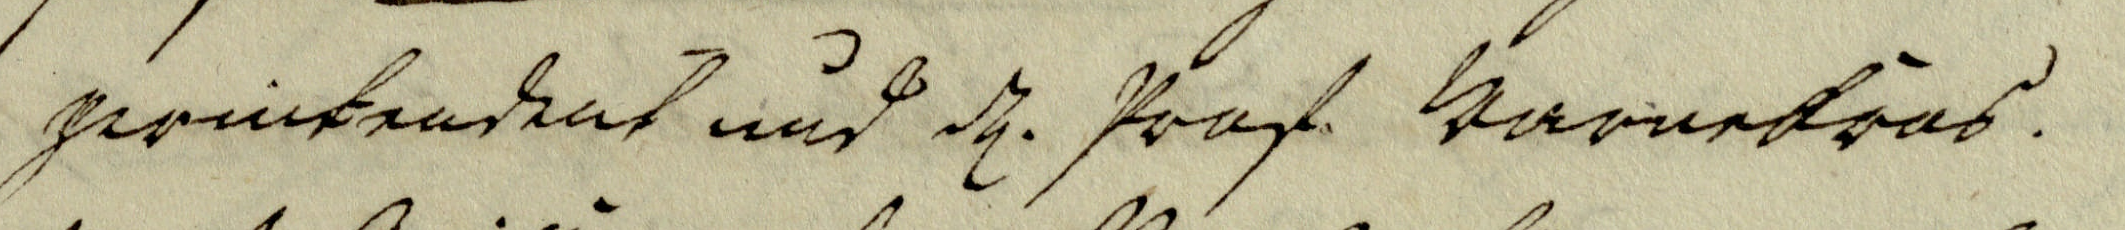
perintendent und dh. Prof. Warnekros.
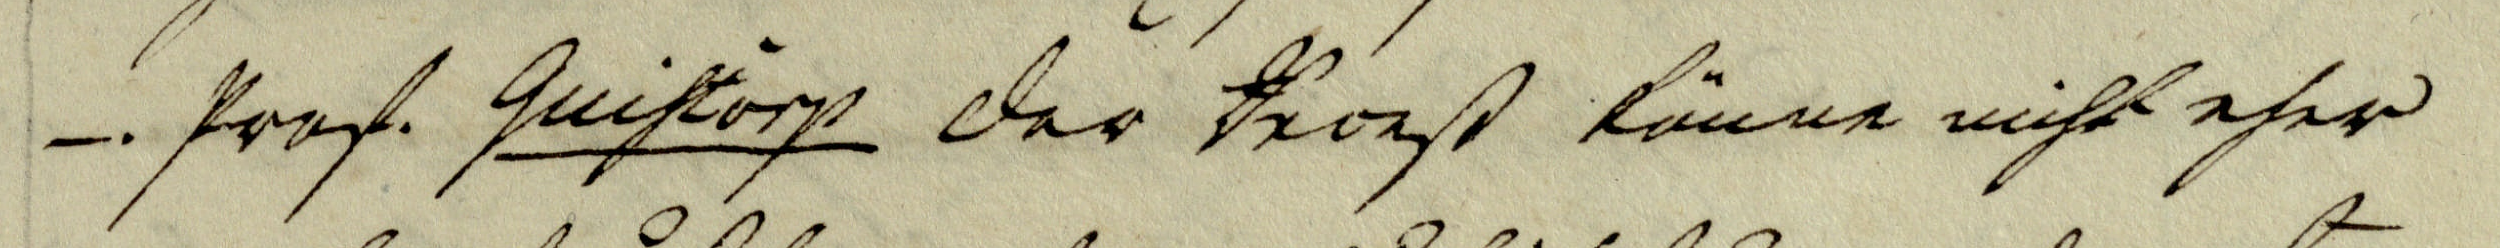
Prof. Quistorp. Der Receß könne nicht eher
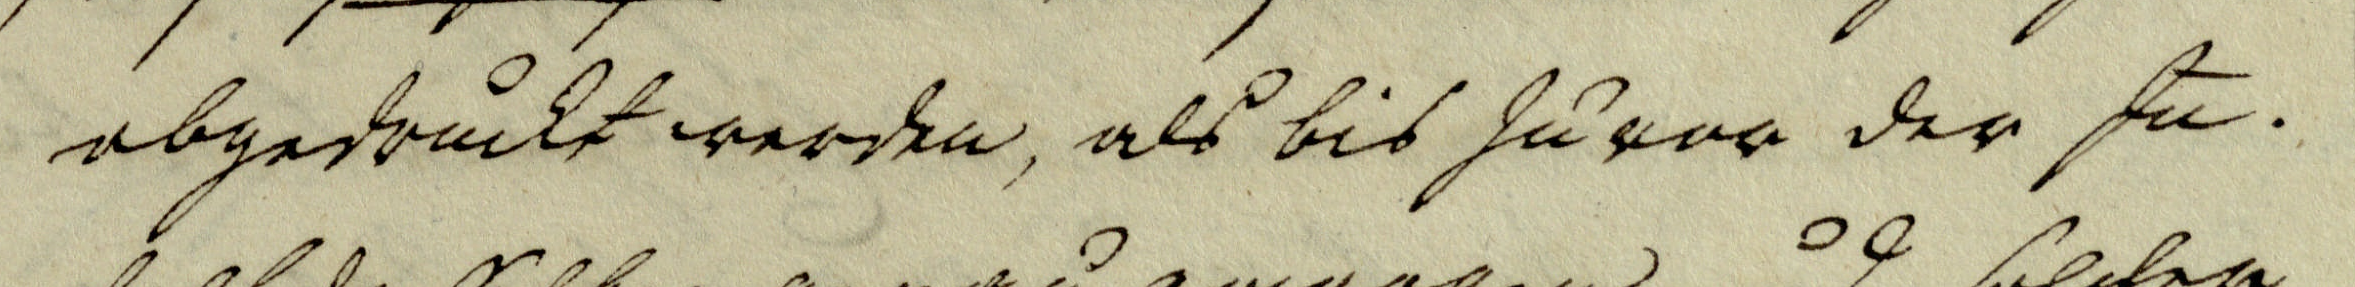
abgedruckt werden, als bis zuvor der In¬
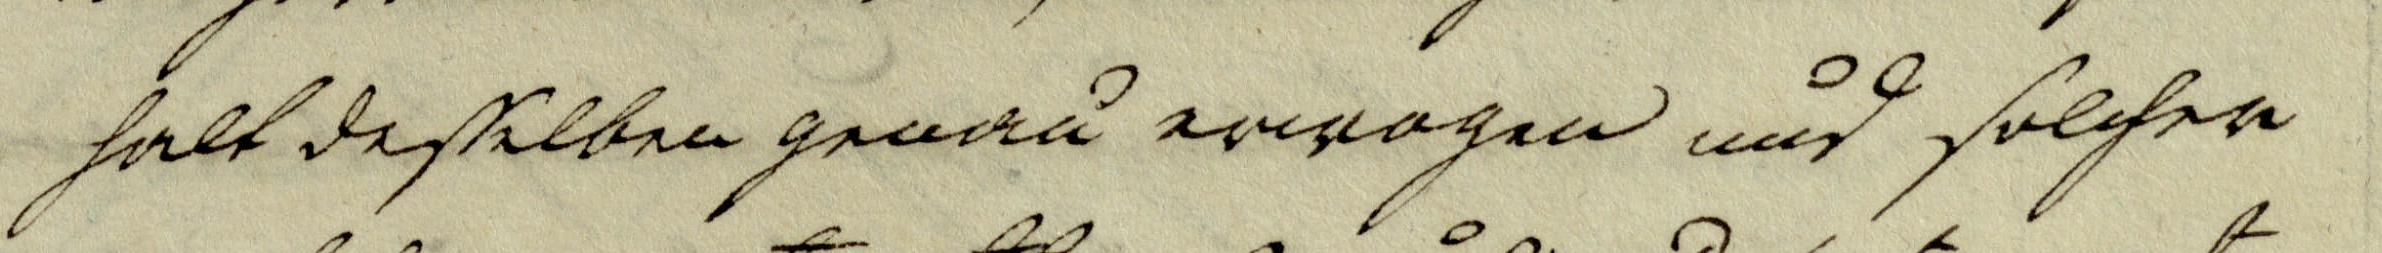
halt desselben genau erwogen und solcher
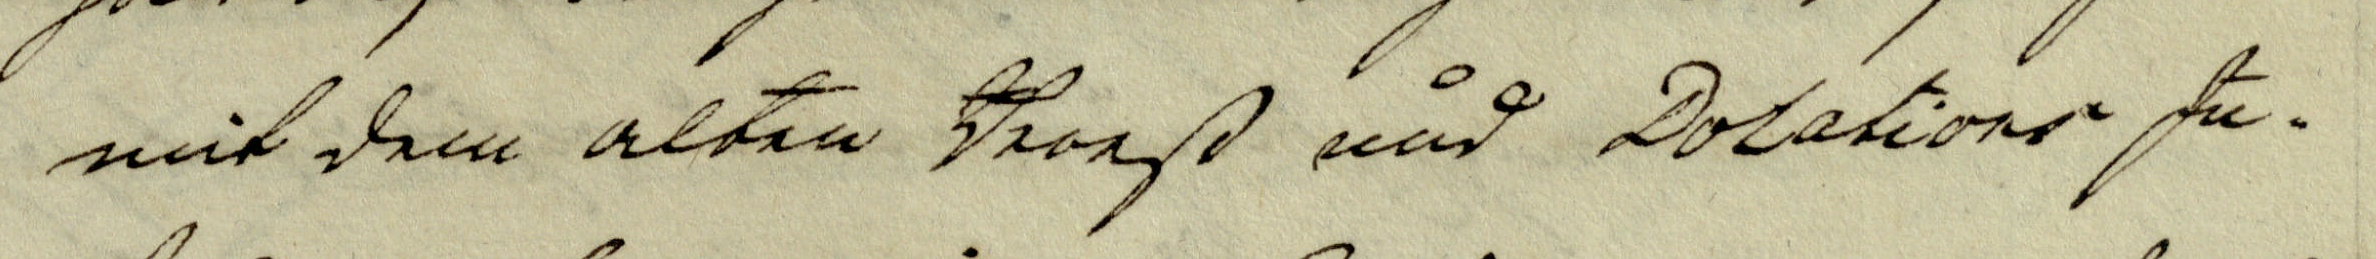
mit dem alten Receß und Dotations In-
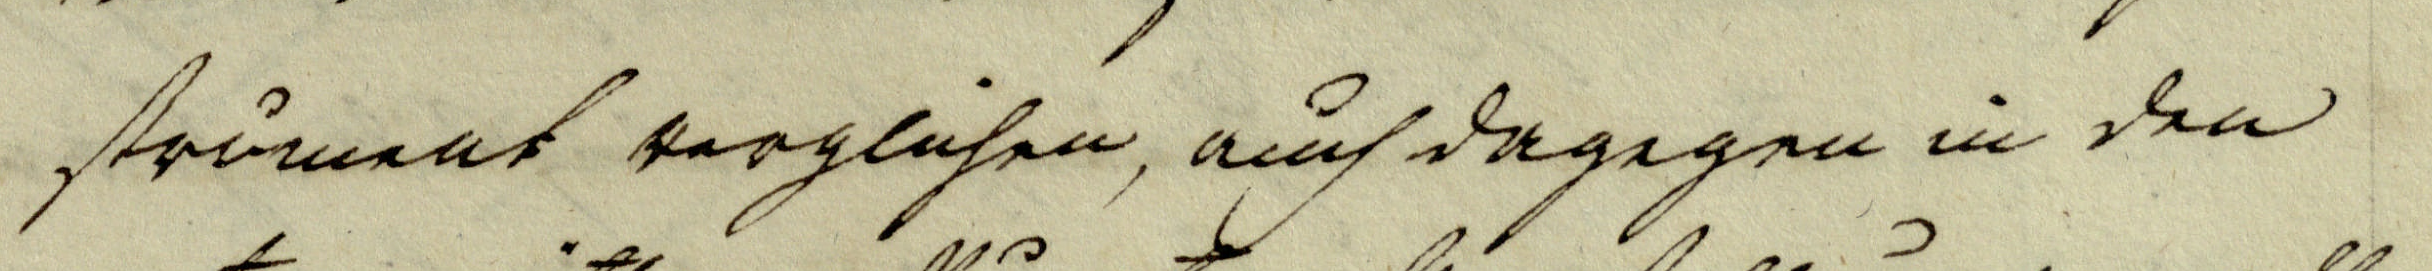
strument verglichen, auch dagegen in den
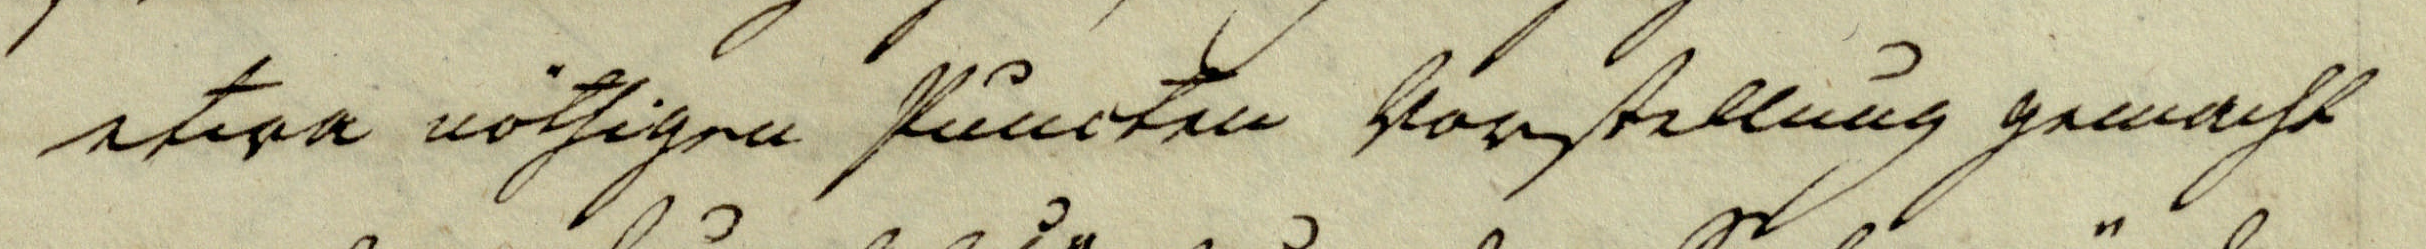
etwa nöthigen Punkten Vorstellung gemacht
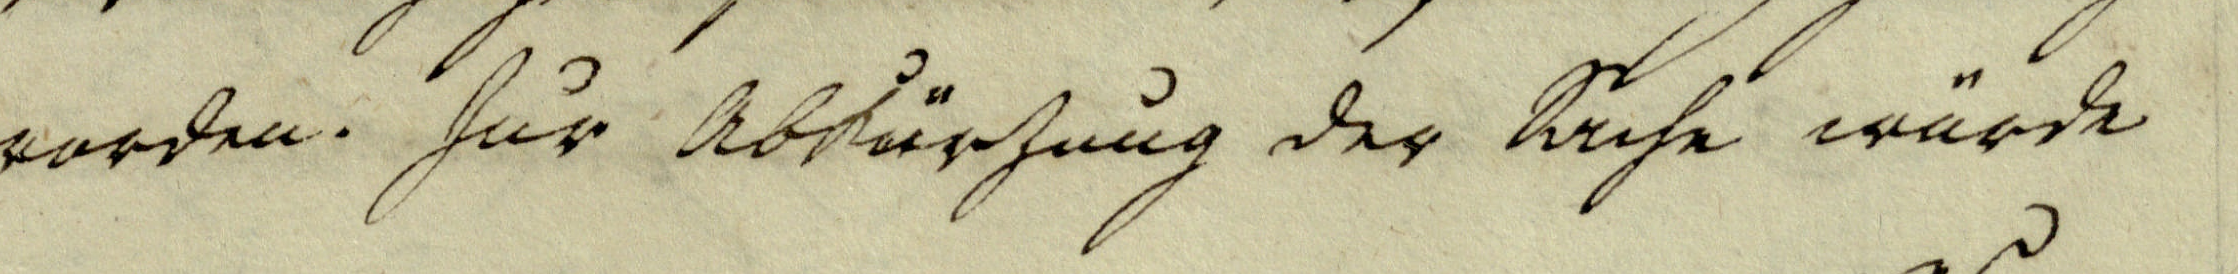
worden. Zur Abkürzung der Sache würde
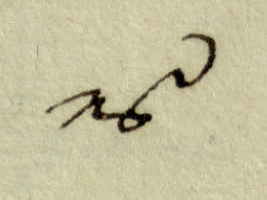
es
